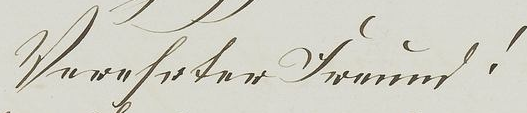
Verehrter Freund!
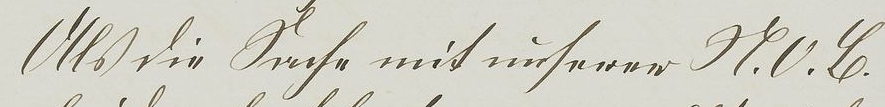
Als die Sache mit unserer N.O.B.
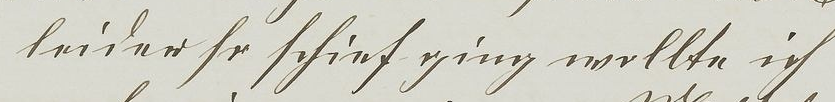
leider so schief ging wollte ich
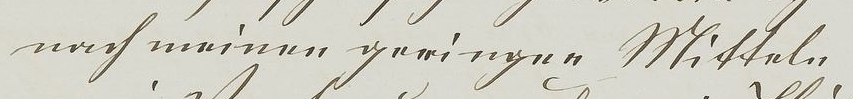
nach meinen geringen Mitteln
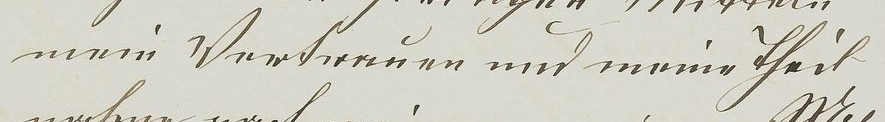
mein Vertrauen und meine Theil-
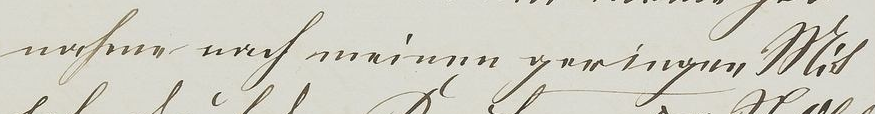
nahme nach meinen geringen Mit-
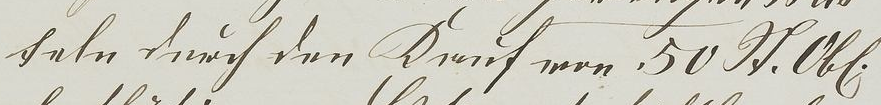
teln durch den Kauf von 50 St. Obl.
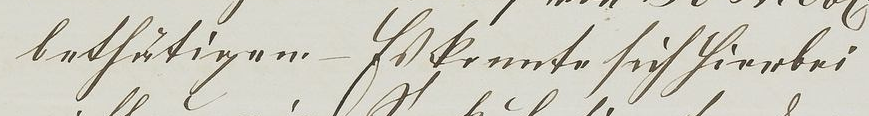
bethätigen. – Es konnte sich hierbei
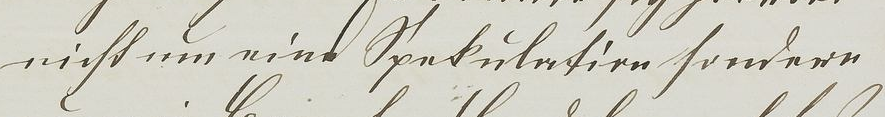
nicht um eine Spekulation sondern
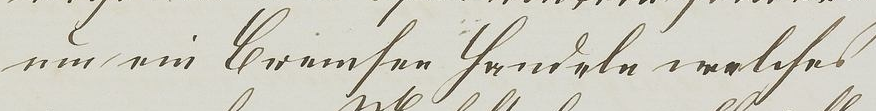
um ein Bremsen handeln welches
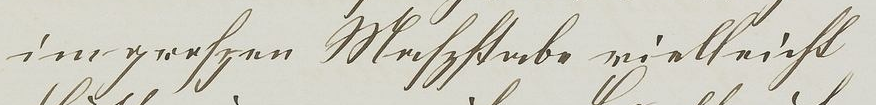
im groszen Maszstabe vielleicht
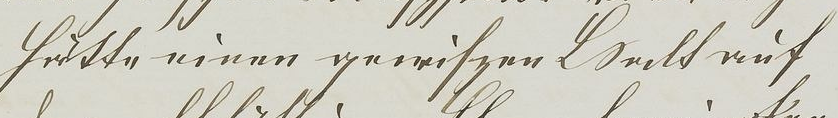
hätte einen gewiszen Halt auf
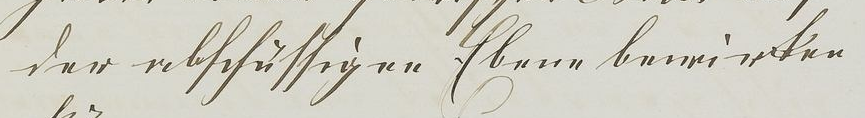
der abschüssigen Ebene bewirken
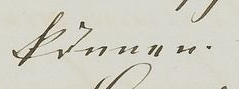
können.
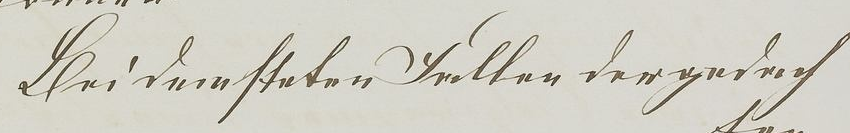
Bei dem steten Fallen der gedach-
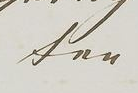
ten
